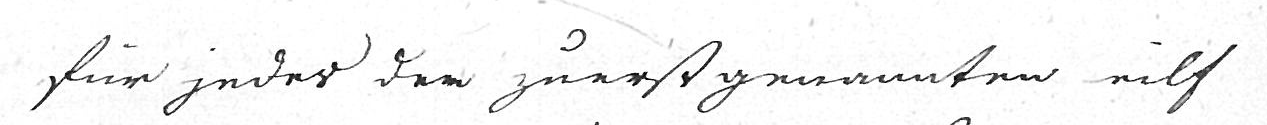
für jedes der zuerstgenannten eilf
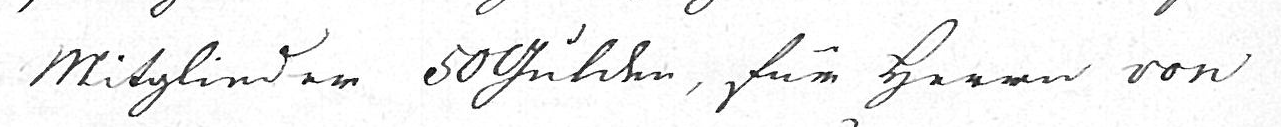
Mitglieder 50 Gulden, für Herrn von
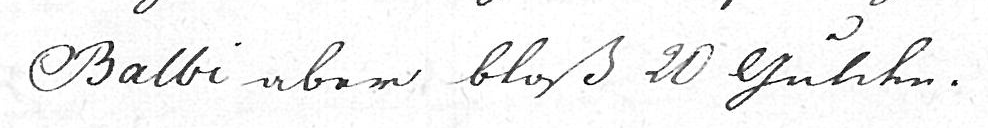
Balbi aber bloß 20 Gulden.
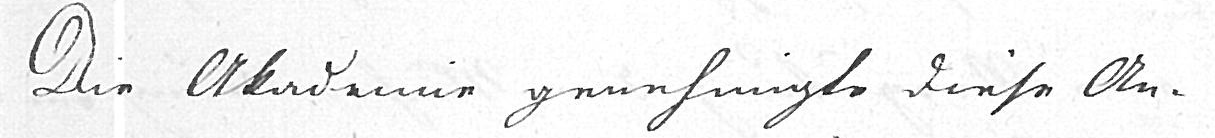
Die Akademie genehmigt diese An-
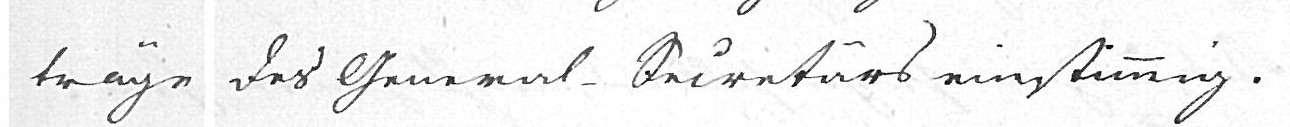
träge des General-Secretärs einstimmig.
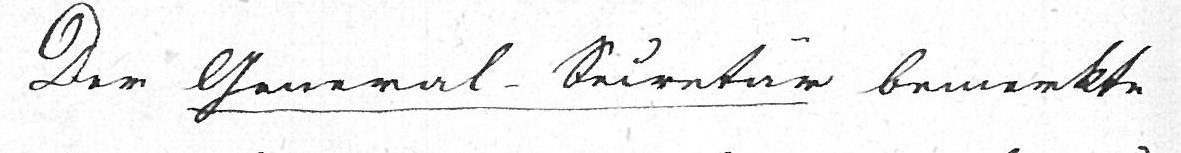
Der General-Secretär bemerkte
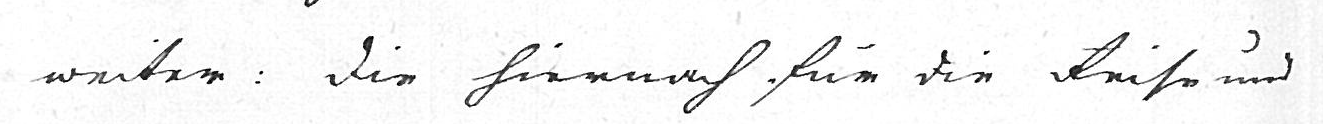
weiter: Die Hiernach für die Reise und
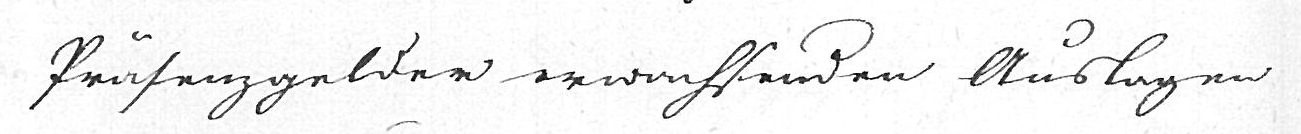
Präsenzgelder erwachsenden Auslagen
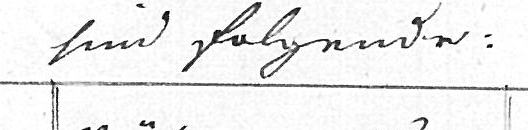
sind folgende:
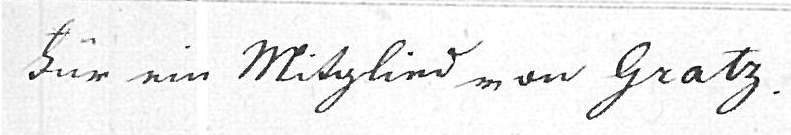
Für ein Mitglied von Gratz
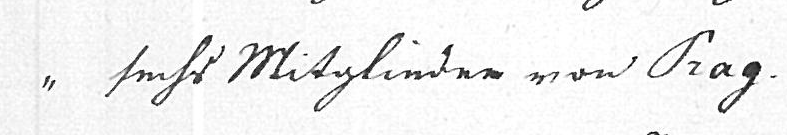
" sechs Mitglieder von Prag
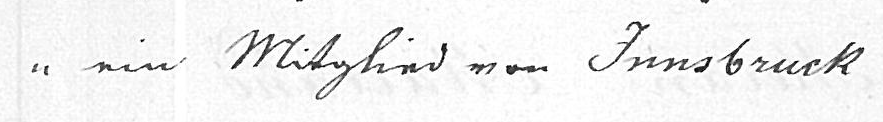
" ein Mitglied von Innsbruck
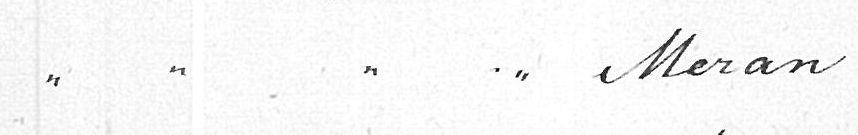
" " " " Meran
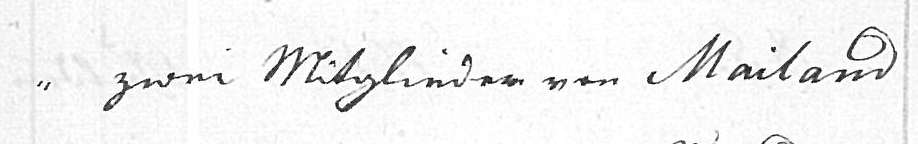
" zwei Mitglieder von Mailand
